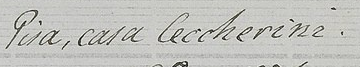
Pisa, casa Ceccherini.
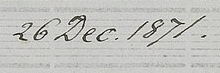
26 Dec. 1871.
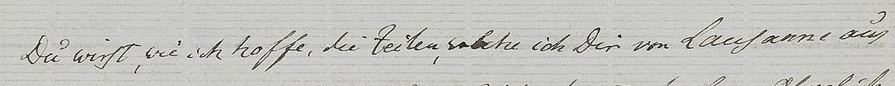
Du wirst, wie ich hoffe, die Zeilen, welche ich Dir von Lausanne aus
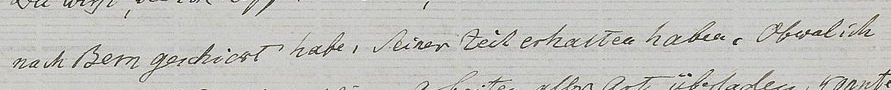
nach Bern geschickt habe, seiner Zeit erhalten haben. Obwol ich
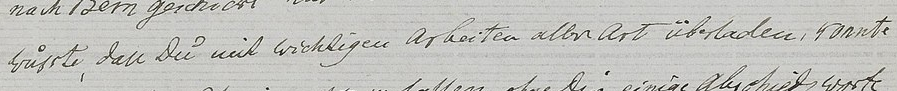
wusste, dass Du mit wichtigen Arbeiten aller Art überladen, konnte
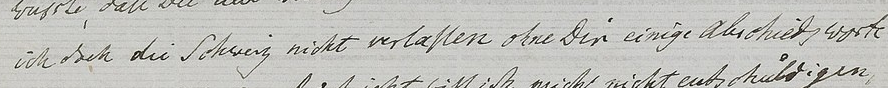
ich doch die Schweiz nicht verlassen ohne Dir einige Abschiedsworte
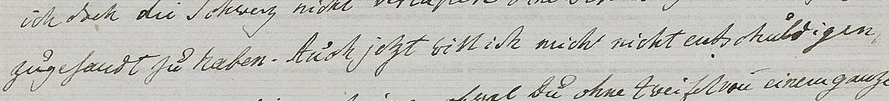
zugesandt zu haben. Auch jetzt will ich mich nicht entschuldigen,
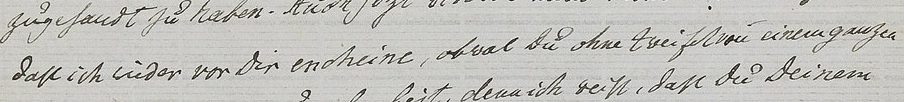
dass ich wieder vor Dir erscheine, obwol Du ohne Zweifel von einem ganzen
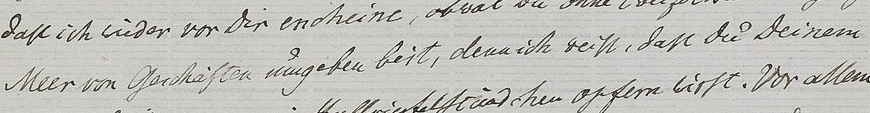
Meer von Geschäften umgeben bist, denn ich weiss, dass Du Deinem
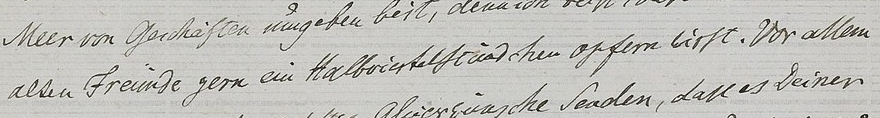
alten Freunde gern ein Halbviertelstündchen opfern wirst. Vor allem
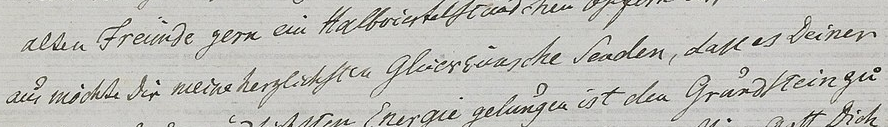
aus möchte Dir meine herzlichsten Glückwünsche senden, dass es Deiner
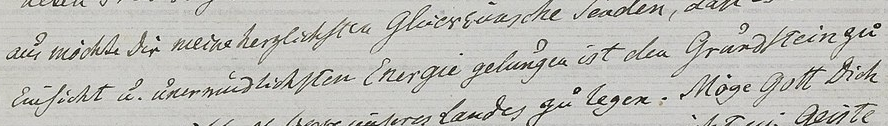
Einsicht u. unermüdlichsten Energie gelungen ist den Grundstein zu
